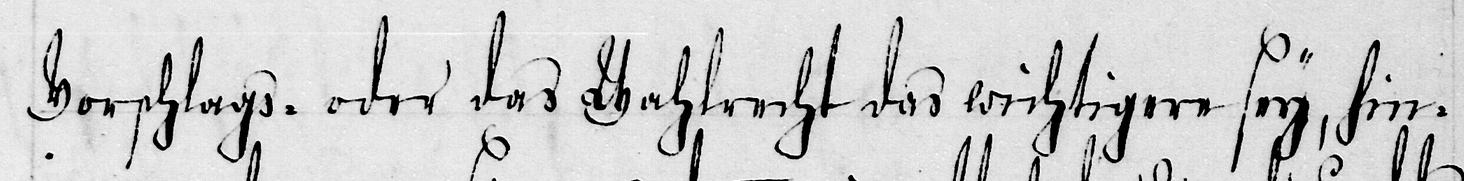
Vorschlags- oder das Wahlrecht das wichtigere sey, hin¬
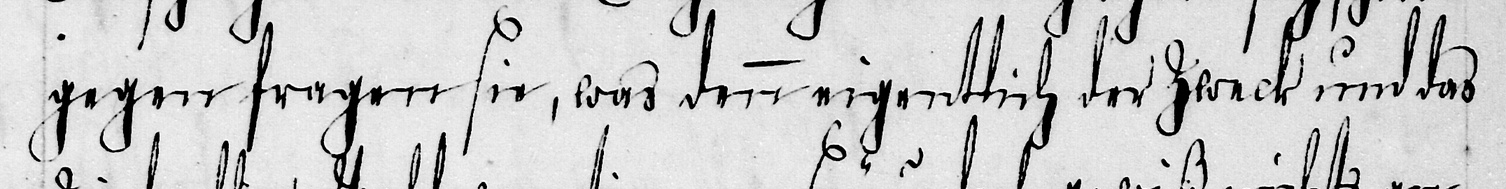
gegen fragen sie, was denn eigentlich der Zweck und das
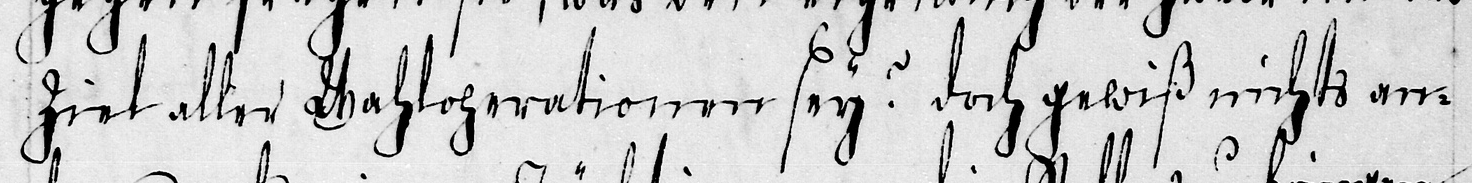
Ziel aller Wahloperationen sey? Doch gewiß nichts an¬
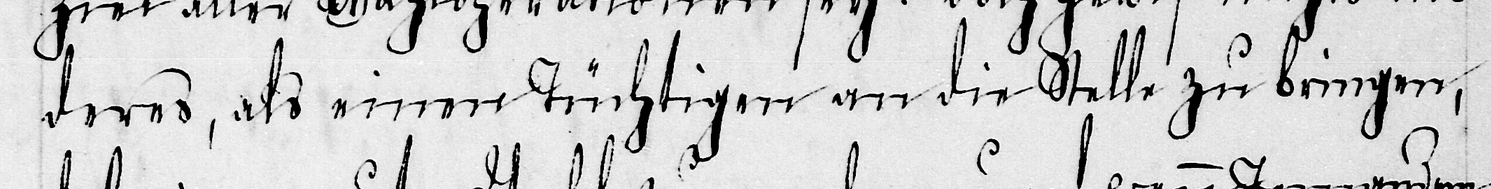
deres, als einen Tüchtigen an die Stelle zu bringen,
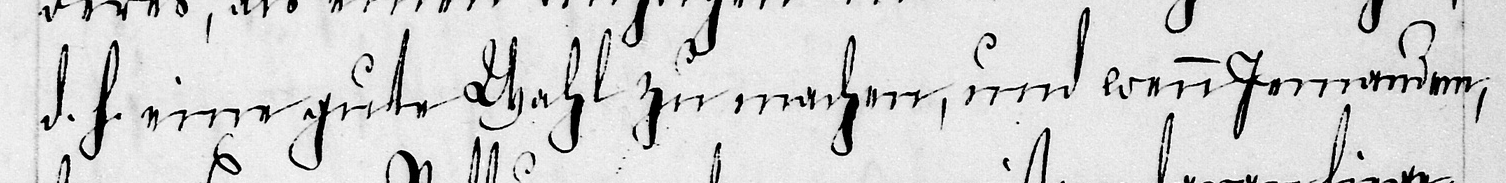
d. h. eine gute Wahl zu machen, und wenn Jemandem,
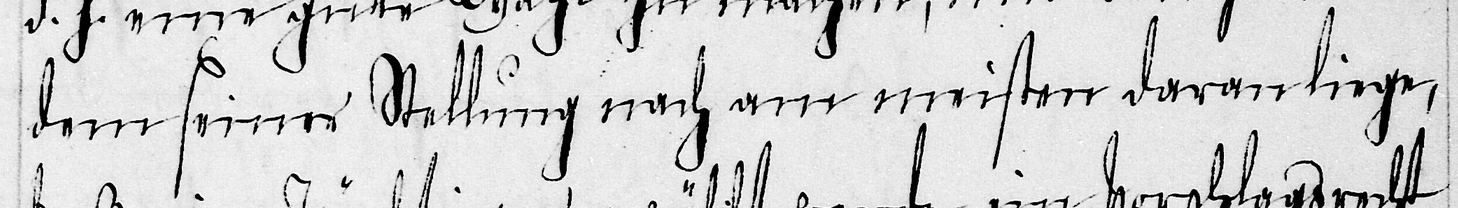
dem seiner Stellung nach am meisten daran liege,
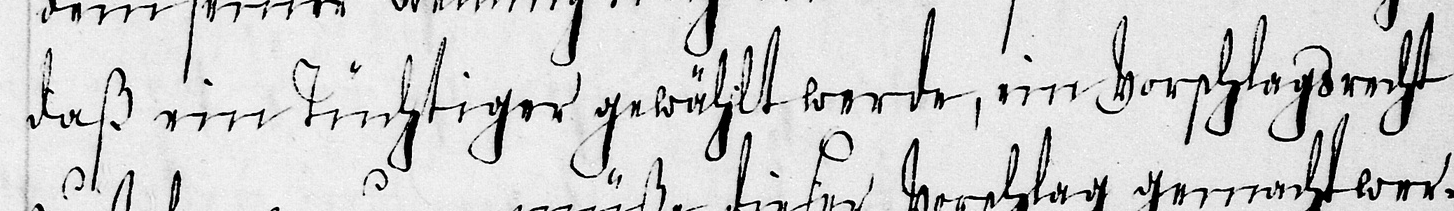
daß ein Tüchtiger gewählt werde, ein Vorschlagsrecht
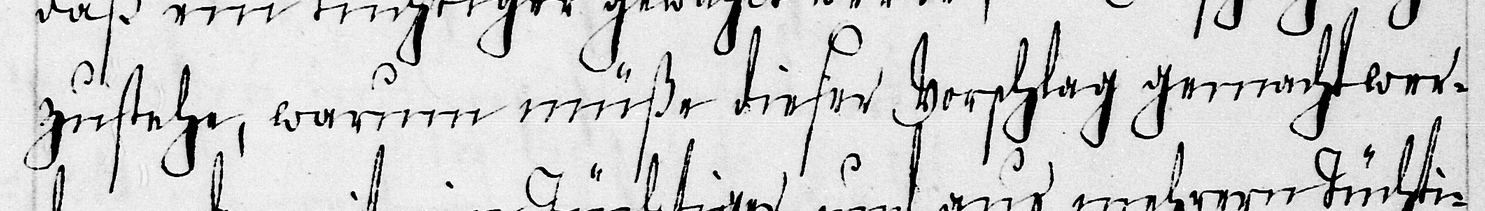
zustehe, warum müße dieser Vorschlag gemacht wer¬
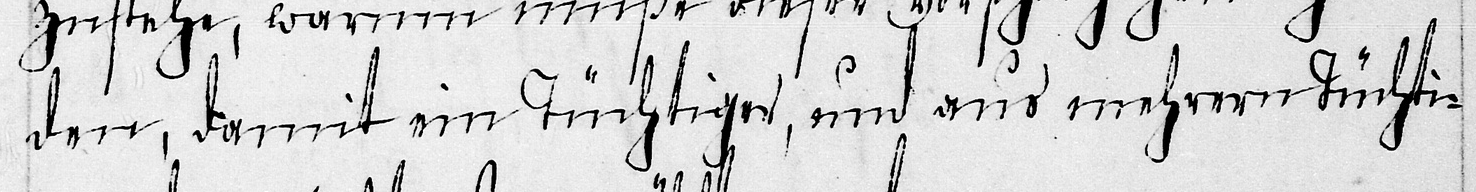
den, damit ein Tüchtiger, und aus mehrern Tüchti¬
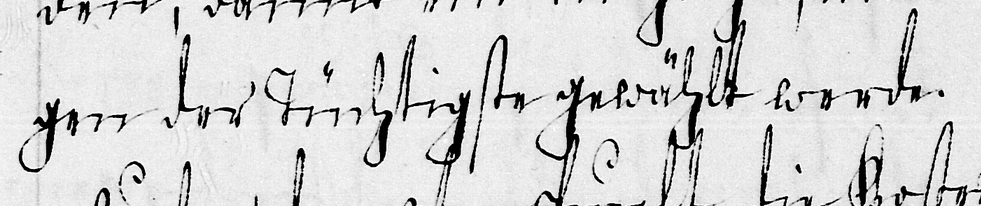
gen der Tüchtigste gewählt werde.
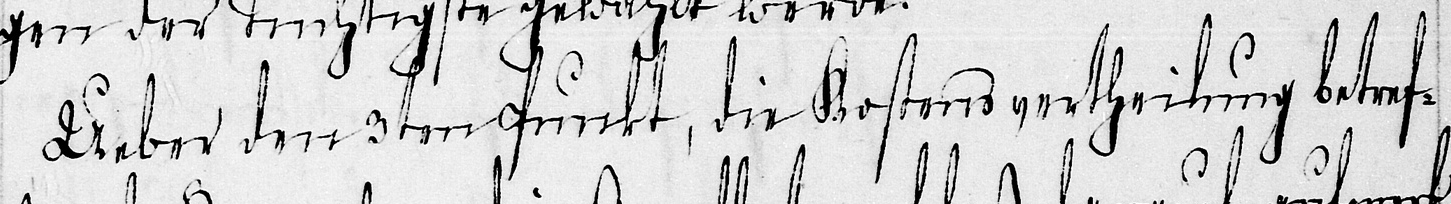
Ueber den 3ten Punkt, die Kostensvertheilung betref¬
